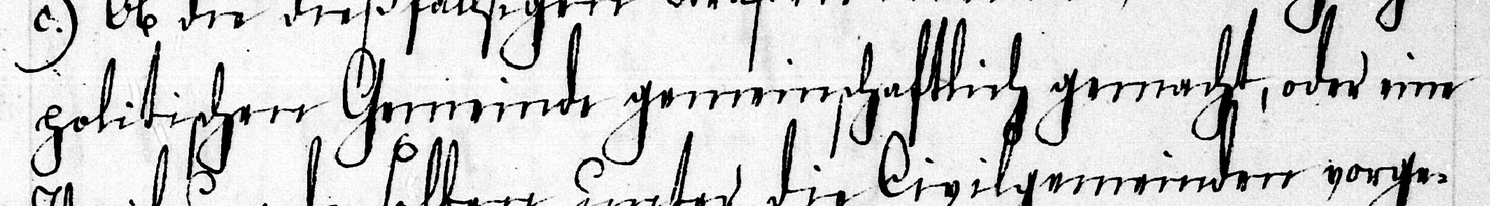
politischen Gemeinde gemeinschaftlich gemacht, oder eine
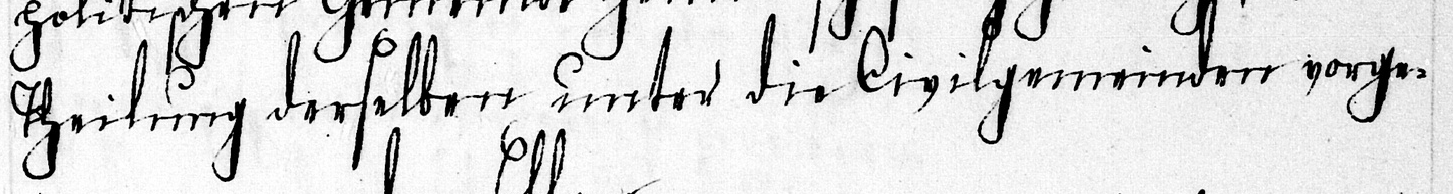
Theilung derselben unter die Civilgemeinden vorge¬
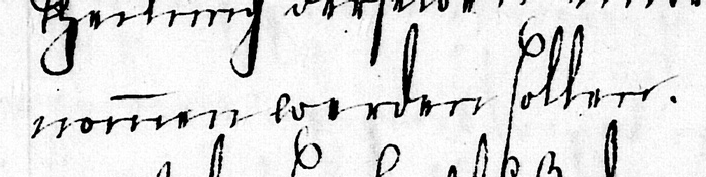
nommen werden sollen.
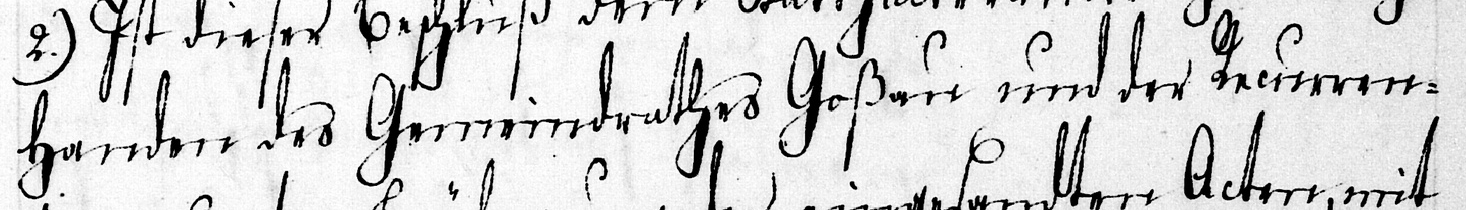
Handen des Gemeindrathes Goßau und der Recurren¬
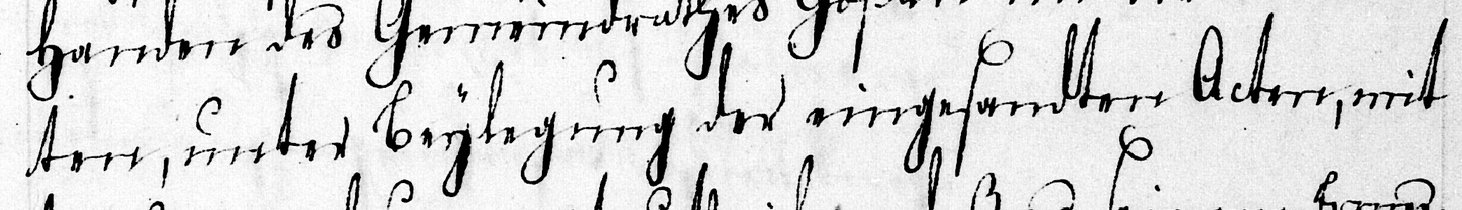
ten, unter Beylegung der eingesandten Acten, mit
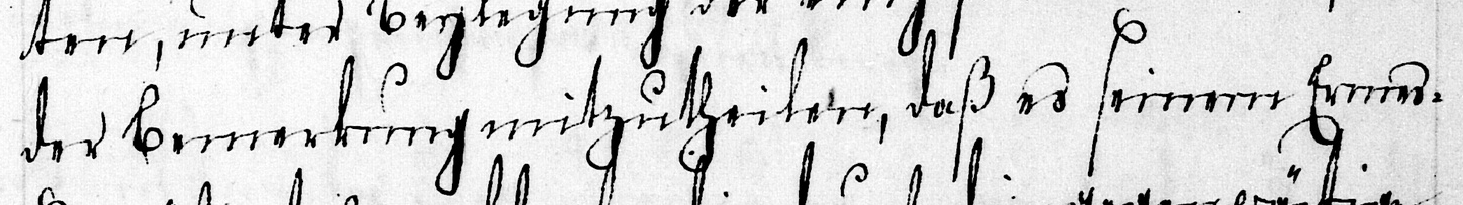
der Bemerkung mitzutheilen, daß es seinem Erme¬
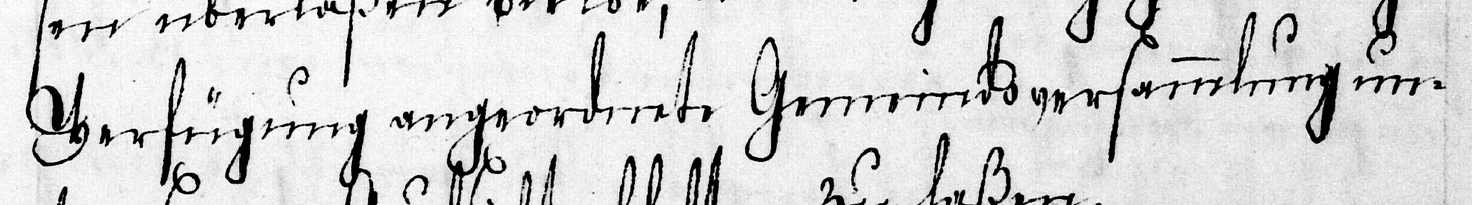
Verfügung angeordnete Gemeindsversammlung un¬
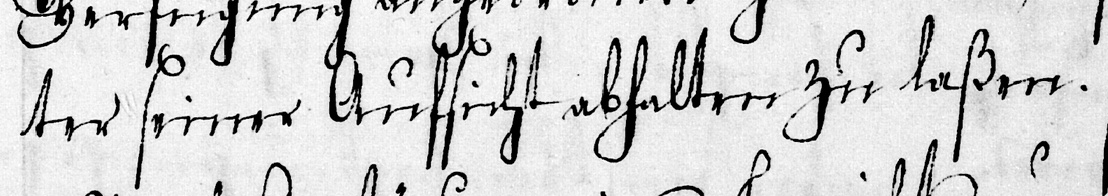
ter seiner Aufsicht abhalten zu laßen.
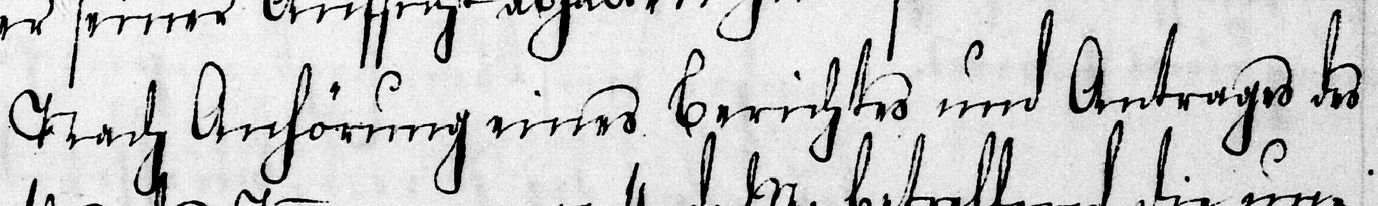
Nach Anhörung eines Berichtes und Antrages des
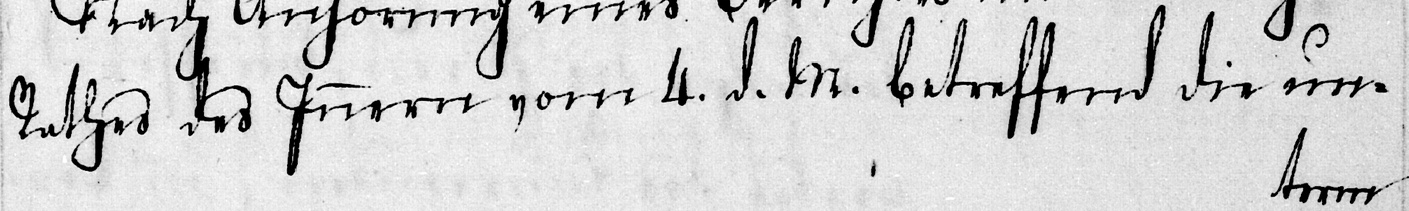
Rathes des Innern vom 4. d. M. betreffend die un
